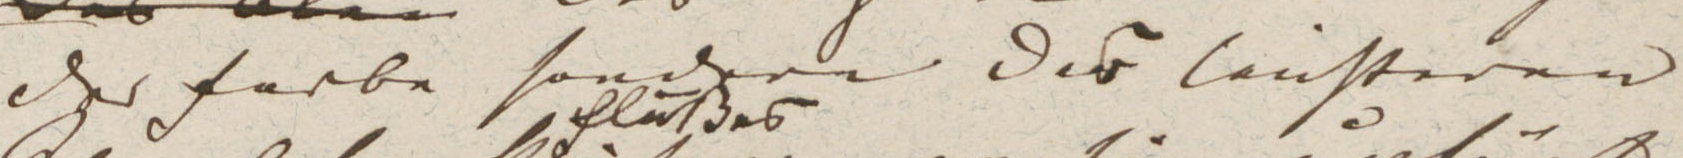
der Farbe sondern ders leichteren
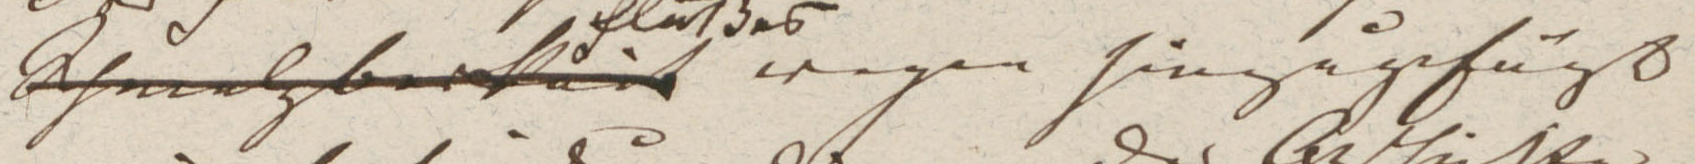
Schmelzbarkeit Flusses wegen hinzugefügt
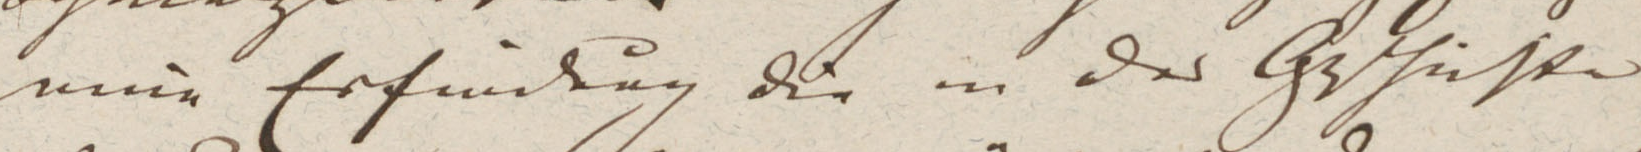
eine Erfindung die in der Geschichte
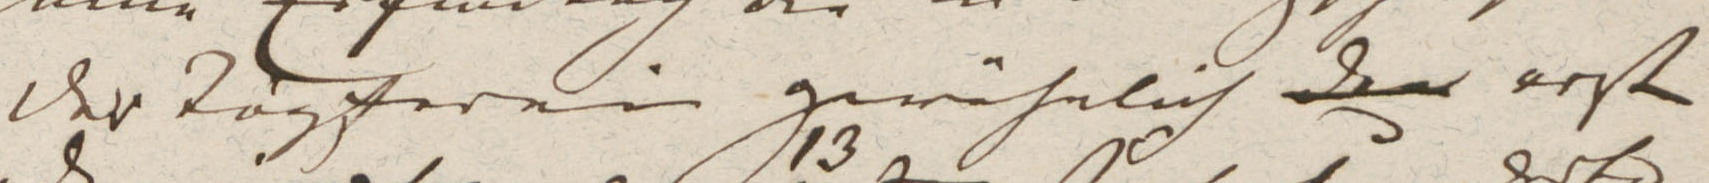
der Töpferei gewöhnlich den erst
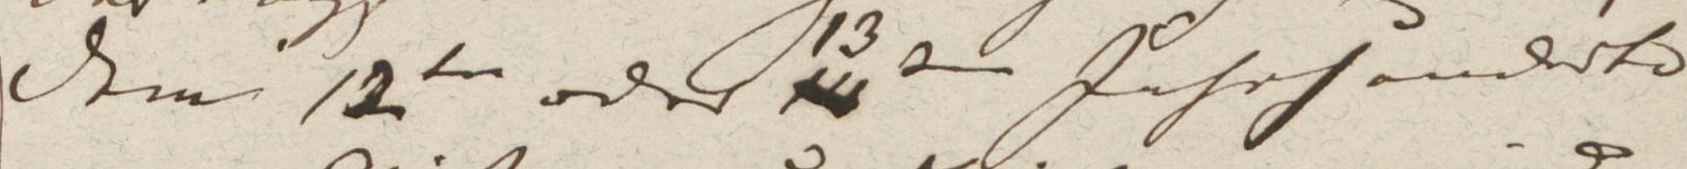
dem 12tenoder 1413ten Jahrhunderte
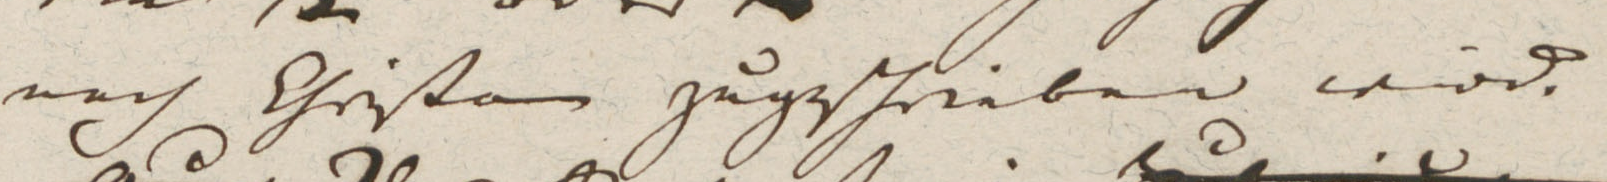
nach Christo zugeschrieben wird.
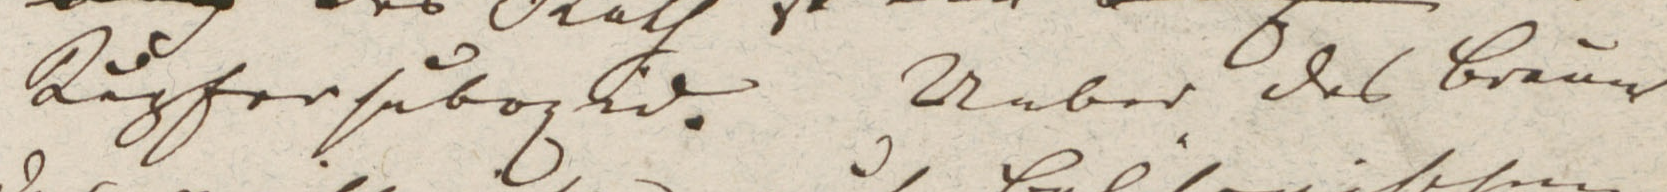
Kupfersuboxid. Ueber das Braun,
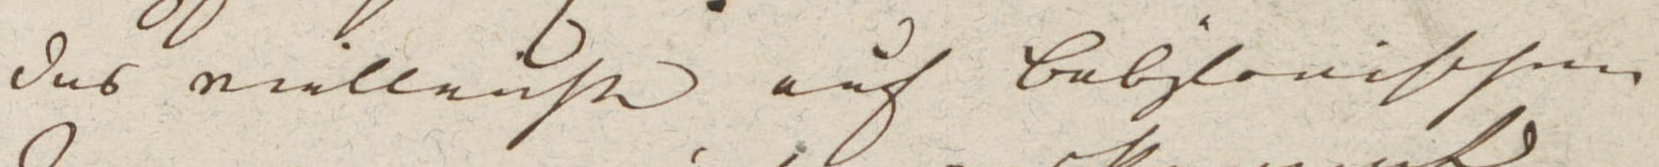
das vielleicht auf Babylonischen
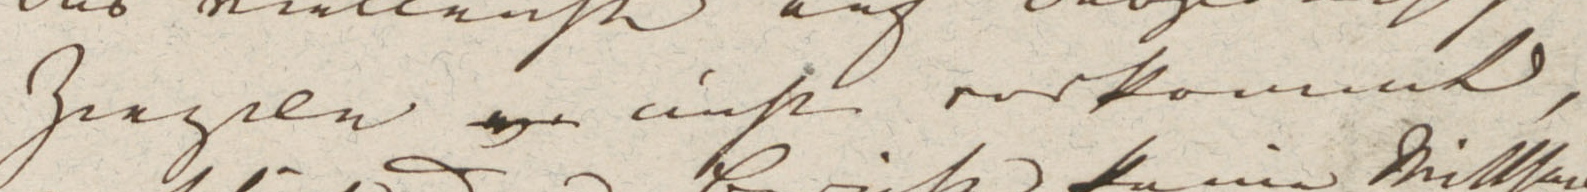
Ziegeln nicht vorkommt,
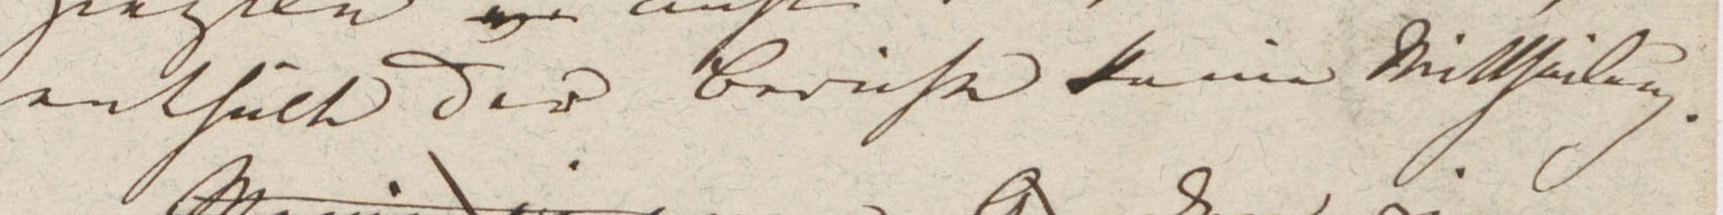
enthält der Bericht keine Mittheilung.
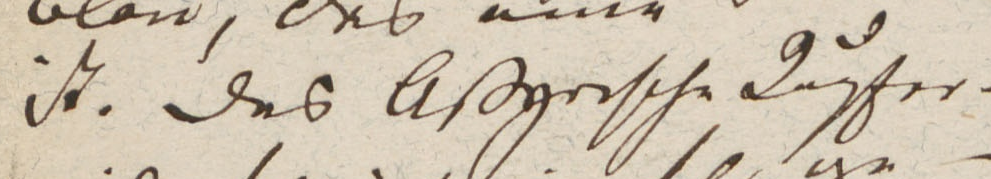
ist. Das Assyrische Kupfer-
